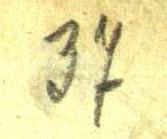37
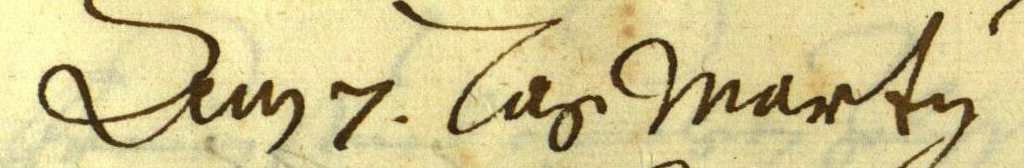Am 7.Tag Martȳ
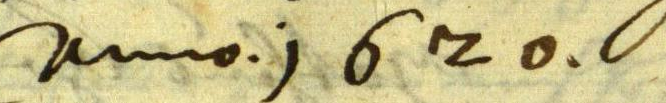Anno. 1620.
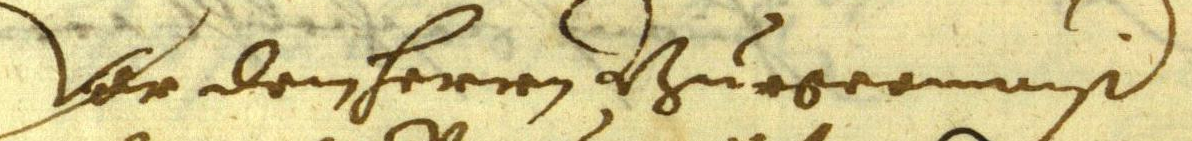Vor den herrn Būrgermaist
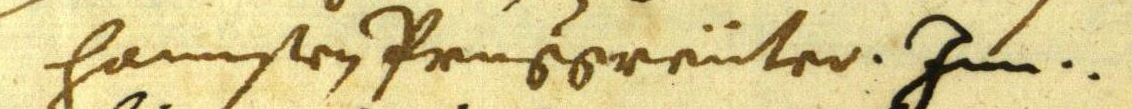hannsen Prūggreüter. Inn¬
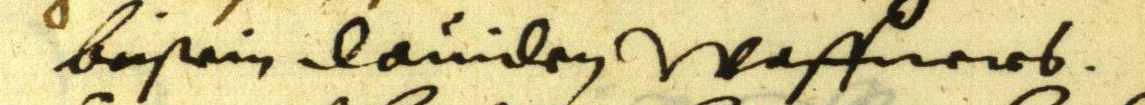beisein Daūiden Waffners.
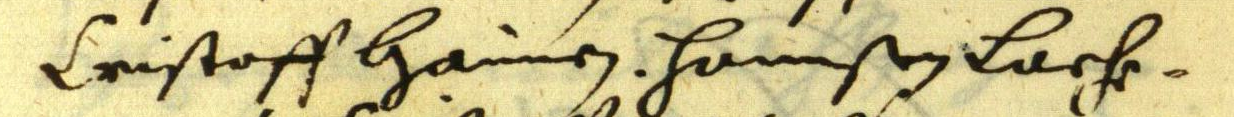Cristoff Haimen. hannsen Loche¬
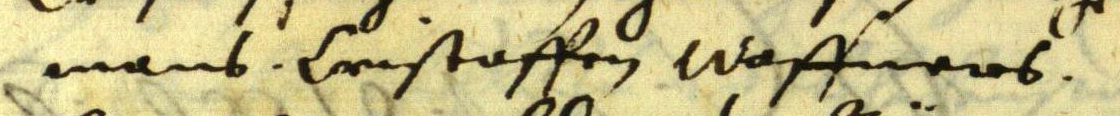mans. Cristoffen Waffners.
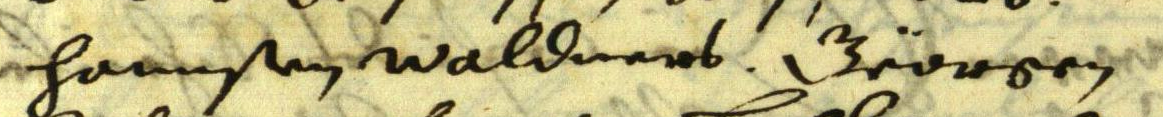hannsen Waldners. Geörgen
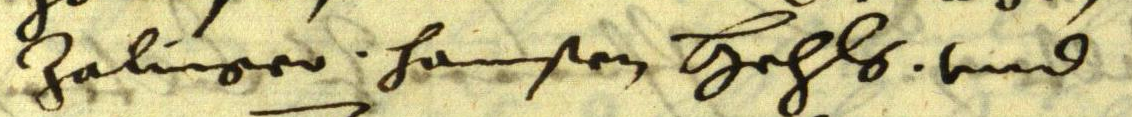Zalinger. hannsen Hehls. vnd
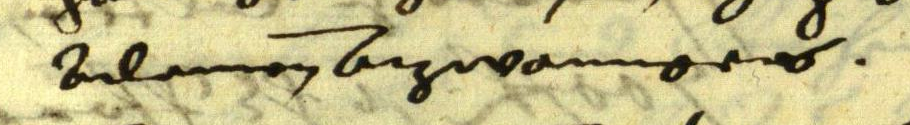Adamen Azwanngers.
